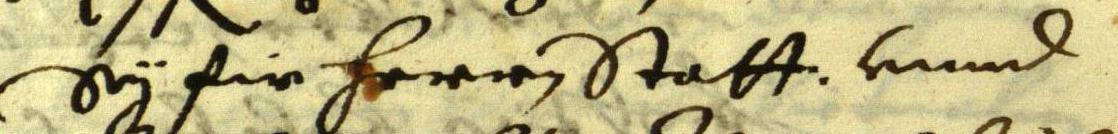Sÿ fir herrn Statt: vnnd
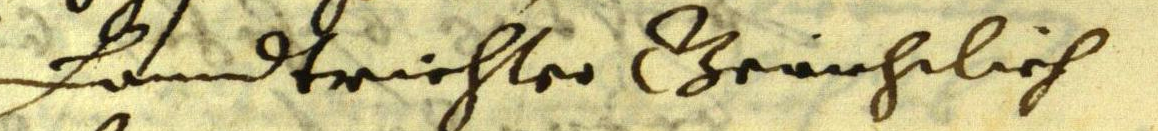Lanndtrichter Gerichtlich
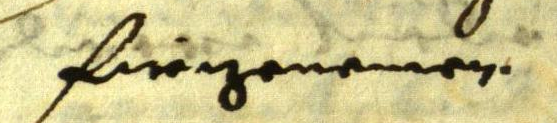firzenenem.
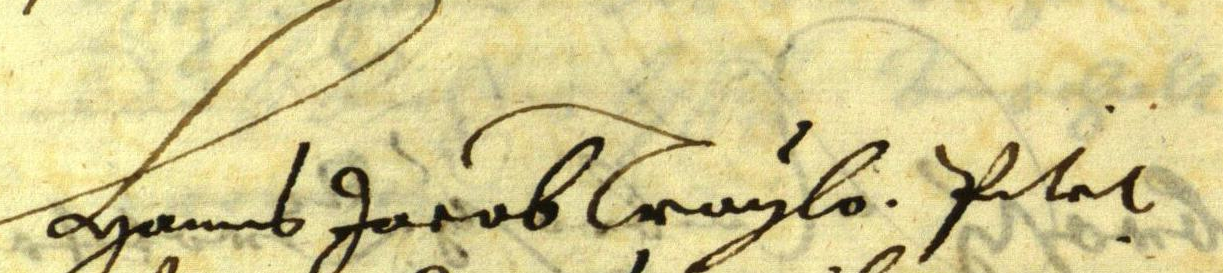Hanns Jacob Traȳlo. Pitet
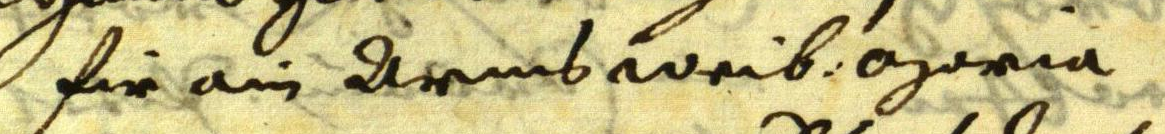fir ain Armes Weib: Maria
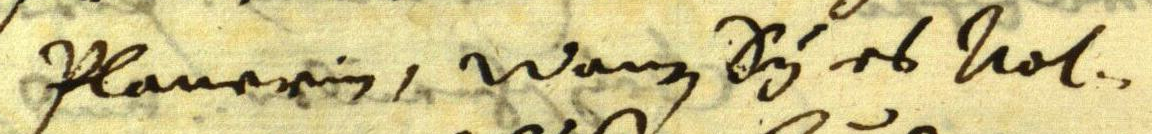Plauerin, wann Sȳ es Not¬
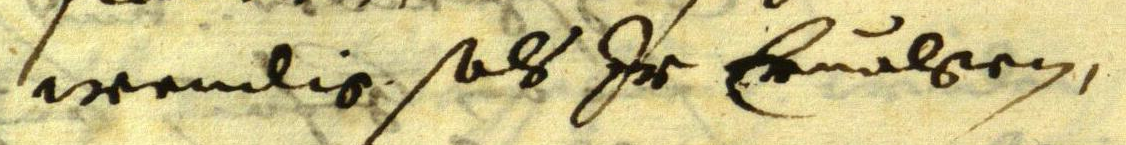wendig. sols Ir Eruōlgen.
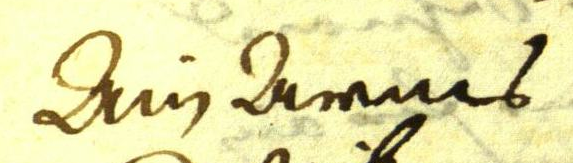Ain Armes
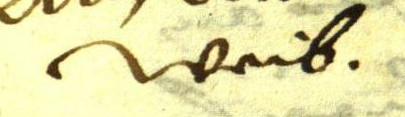Weib.
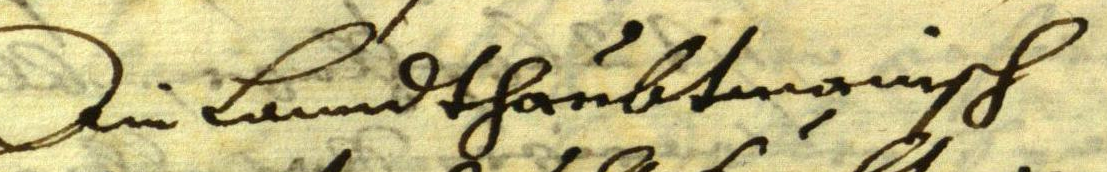Ain Lanndthaūbtmanisch
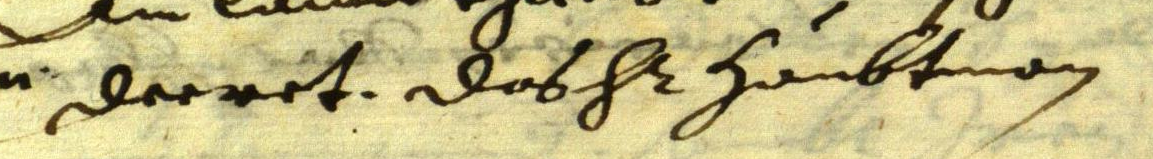decret. das hl Haūbtman
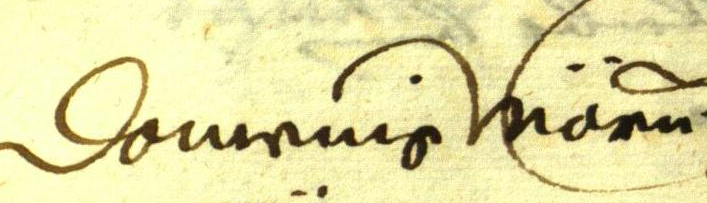Domenig Wörn¬
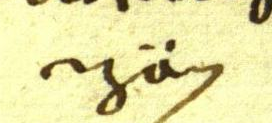zän
